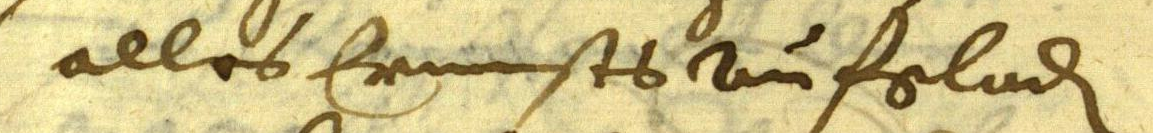alles Ernnsts Aūfglad
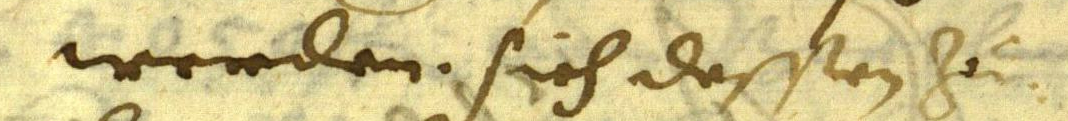werden. sich dessen Zū¬
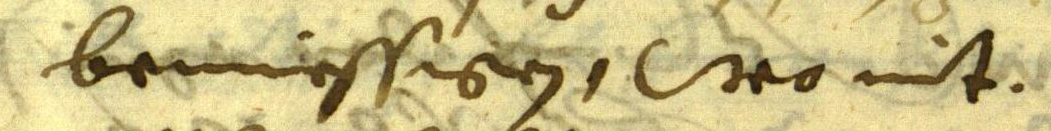bemiessigen, wo nit.
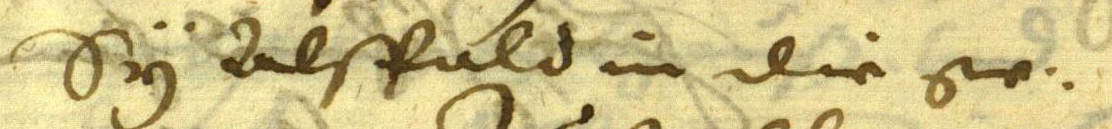Sÿ AlsPald in die ge¬
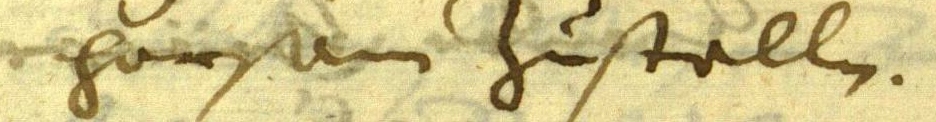horsam Zūstelln.
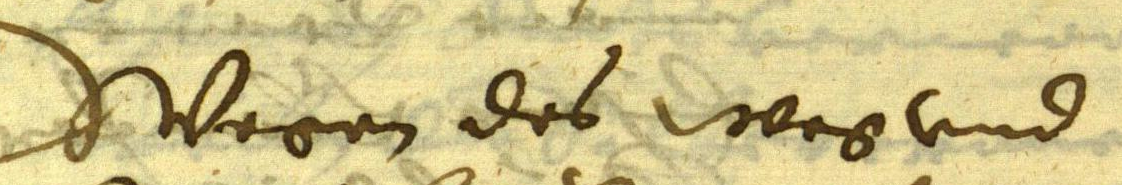Wegen des Weg vnd
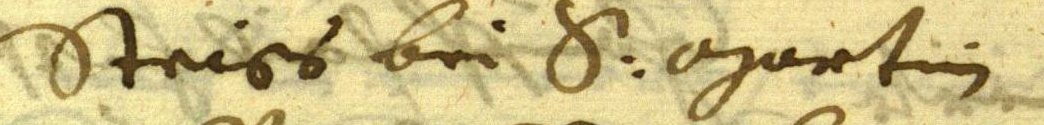Steigs bei S: Martin
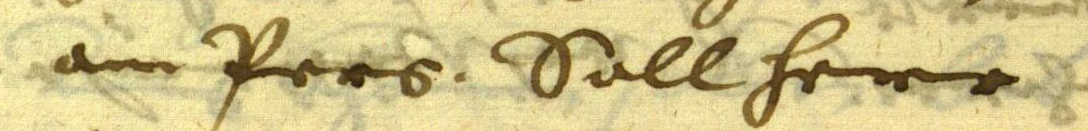am Perg. Soll herr
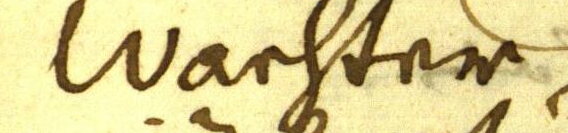Wachter
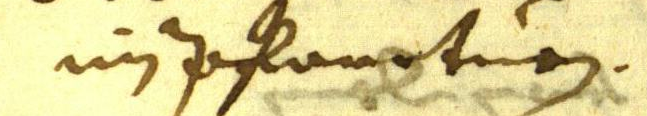im Pfarrtūrn.
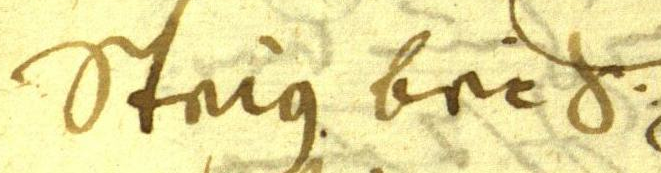Steig bei S:
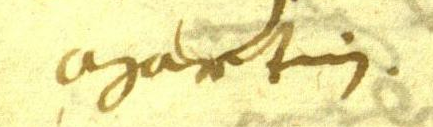Martin.
